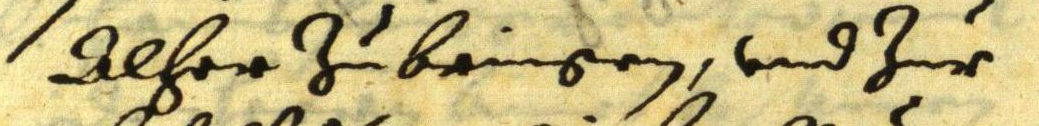Alher Zū bringen, vnd Zūr
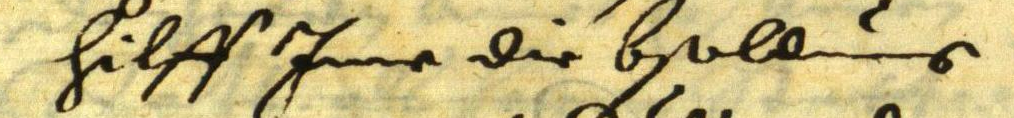hilff Ime die bsoldūng
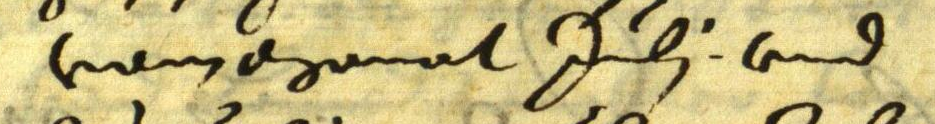vom Monat Jūlj. vnd
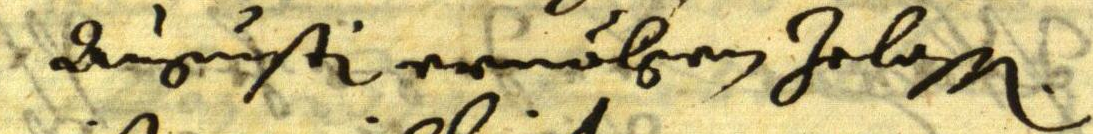Aūgūstj erūolgen Zelass.
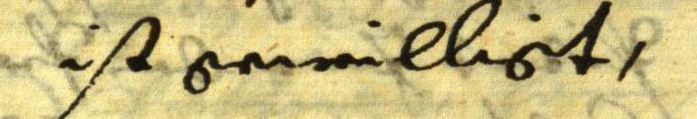ist gewilligt,
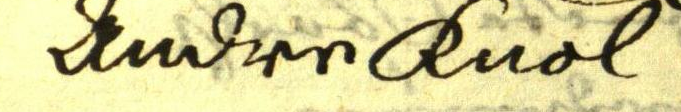Andre Knol
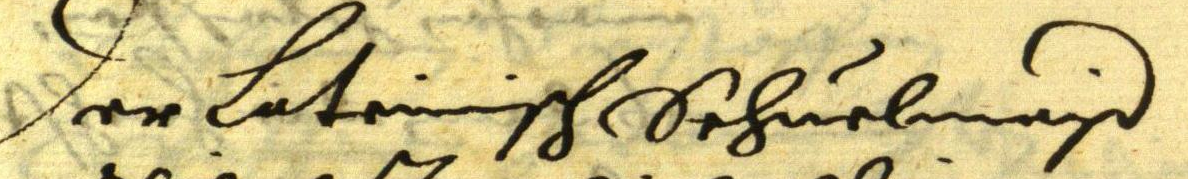Der Lateinisch Schūelmaist
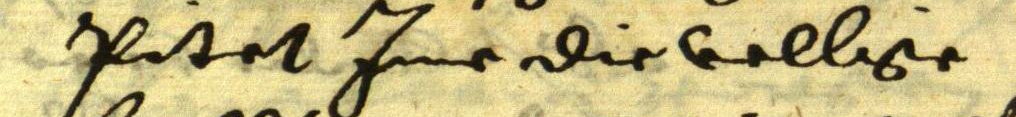Pitet Ime die vellige
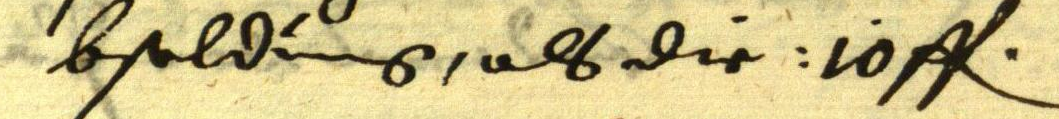bsoldūng, als die: 10 fl.
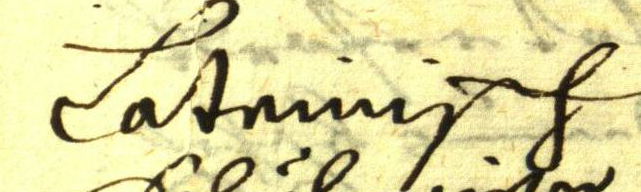Lateinisch
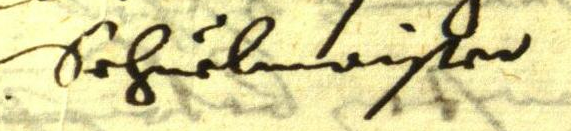Schūelmaister
